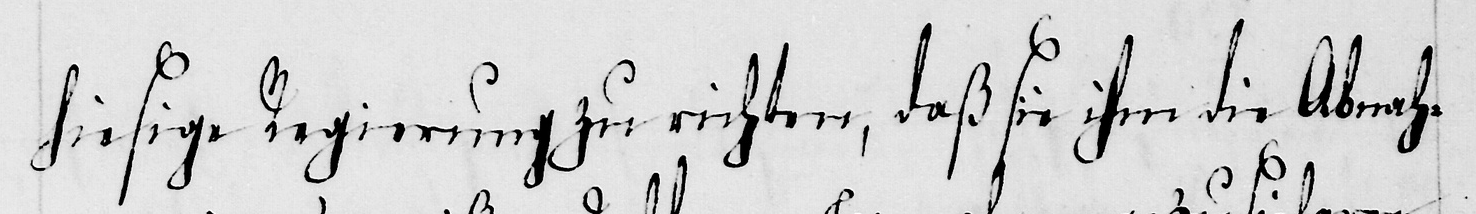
hiesige Regierung zu richten, daß sie ihm die Abnah¬
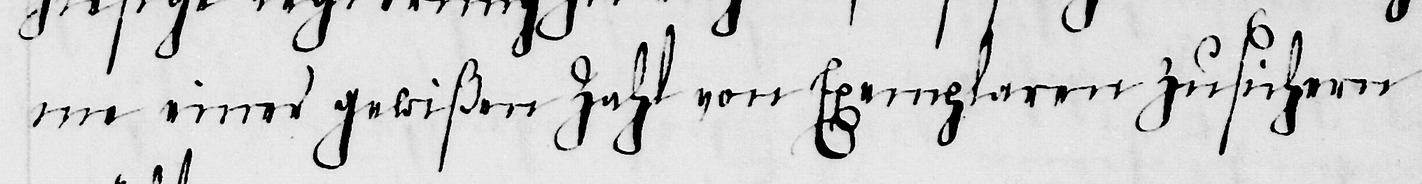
me einer gewißen Zahl von Exemplaren zusichern
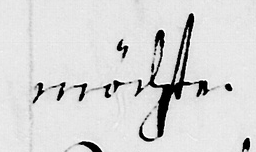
möchte.
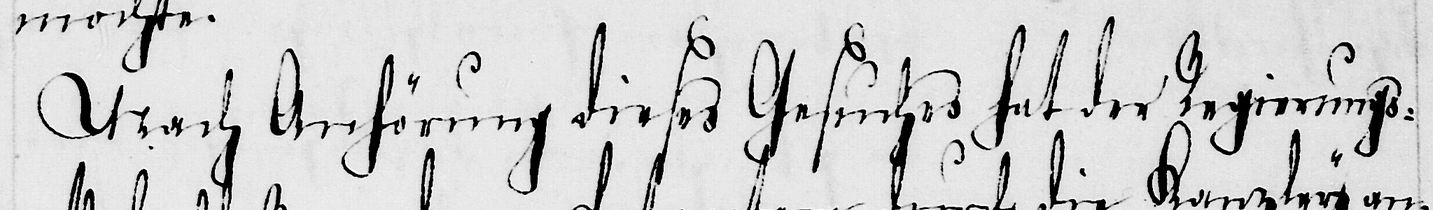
Nach Anhörung dieses Gesuches hat der Regierungs¬
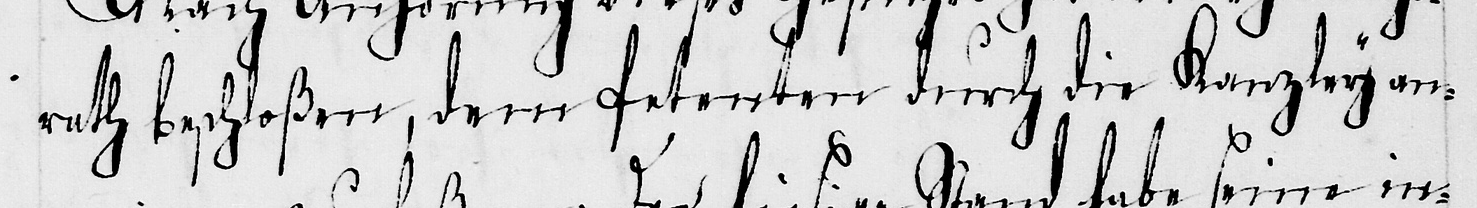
rath beschloßen, dem Petenten durch die Kanzley an¬
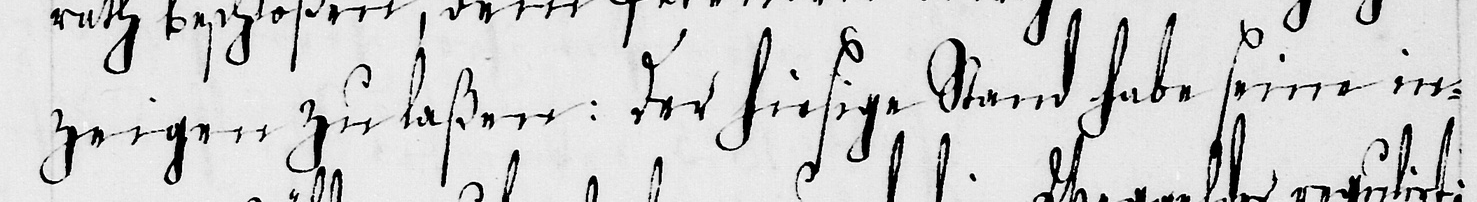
zeigen zu laßen: Der hiesige Stand habe seine in¬
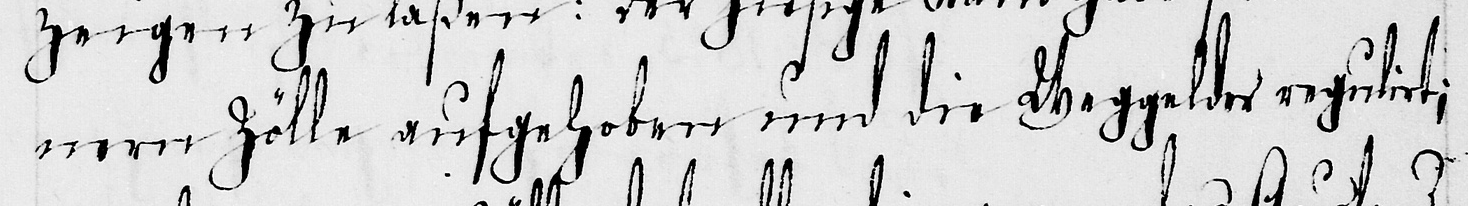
nern Zölle aufgehoben und die Weggelder regulir¬
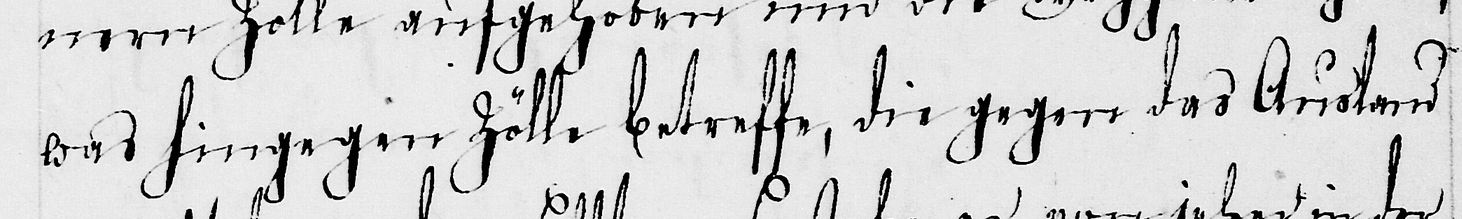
was hingegen Zölle betreffe, die gegen das Ausland
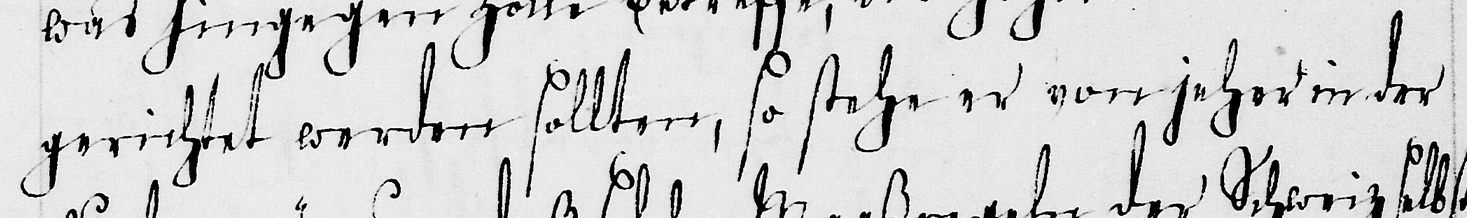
gerichtet werden sollten, so stehe er von jeher in der
